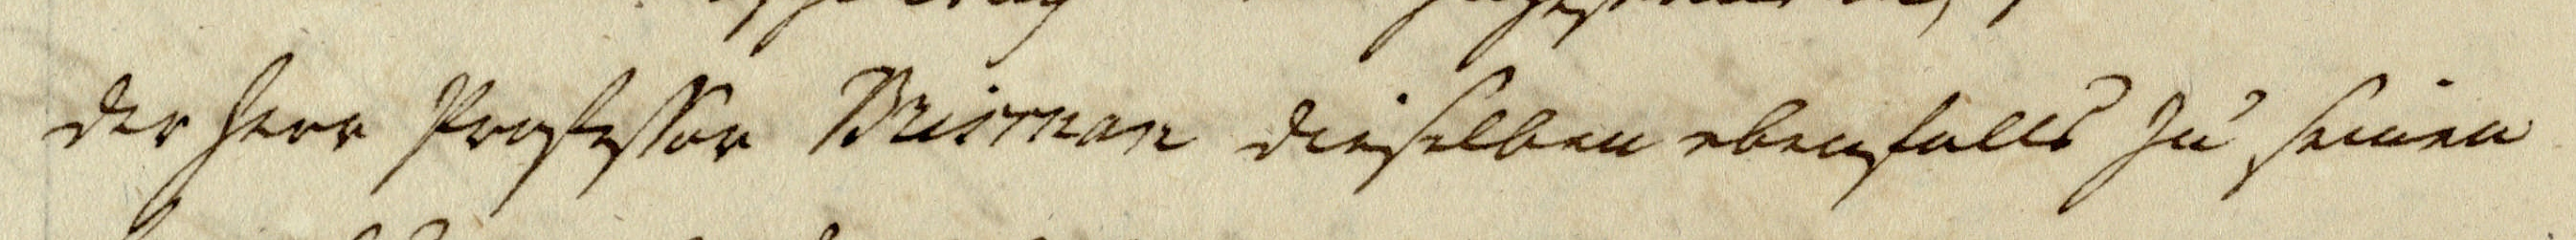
der Herr Professor Brisman dieselben ebenfalls zu seinen
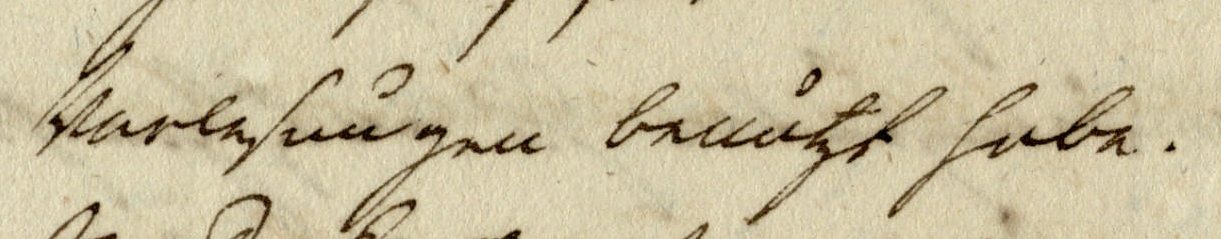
Vorlesungen benutzt habe.
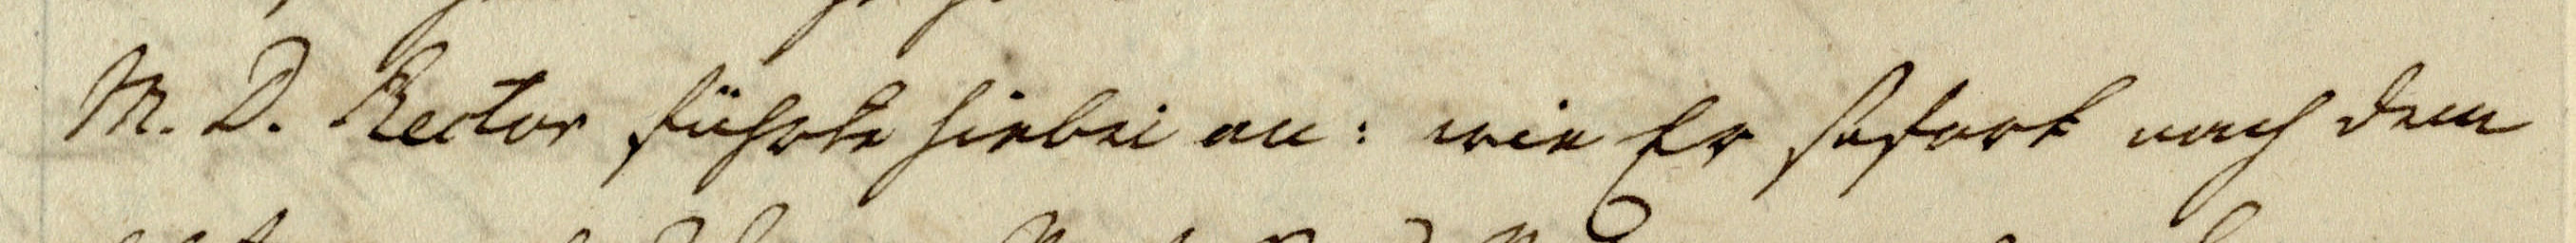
M. D. Rector führte hiebei an: wie Er sofort nach dem
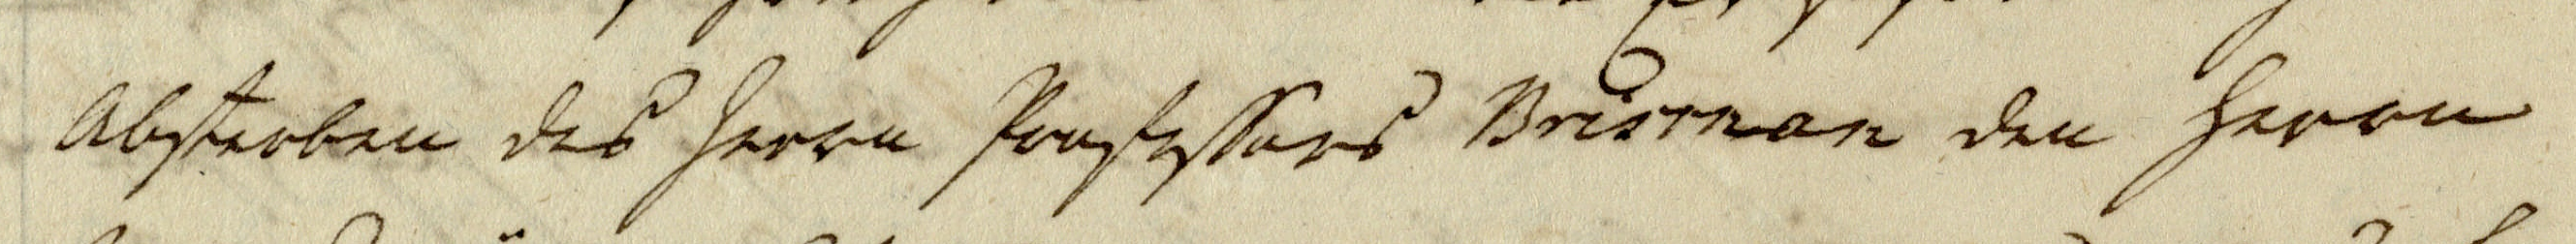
Absterben des Herrn Professors Brisman den Herrn
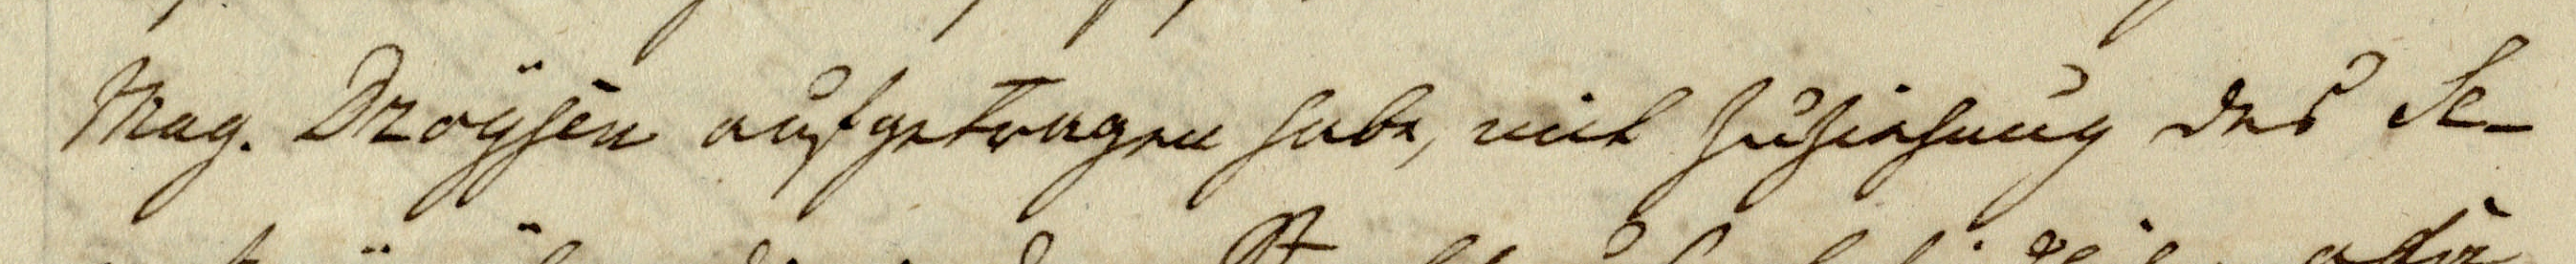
Mag. Droÿsen aufgetragen habe, mit Zuziehung des Se¬
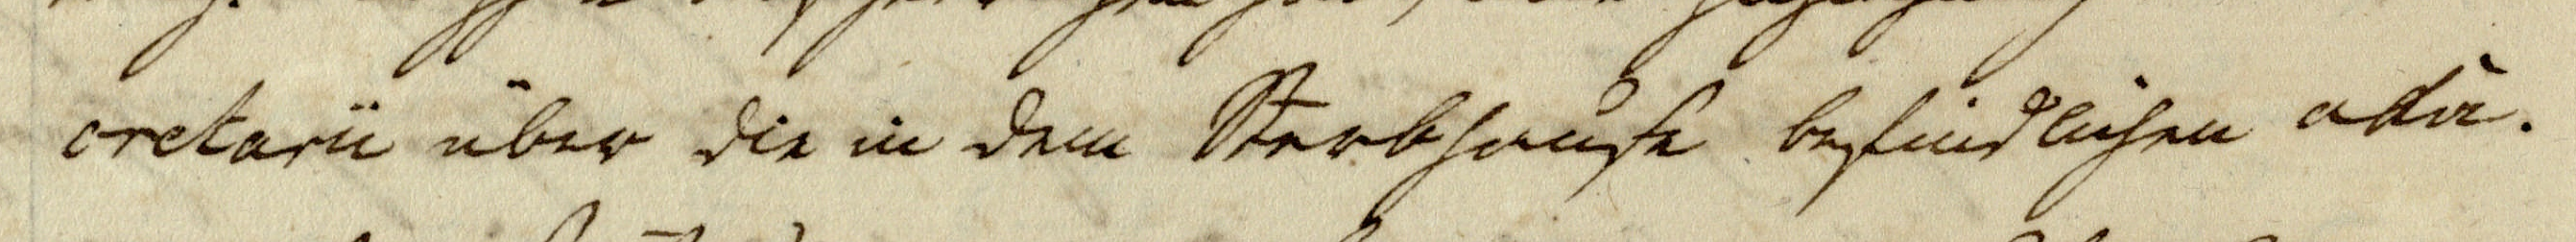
cretarii über die in dem Sterbhause befndlichen aka¬
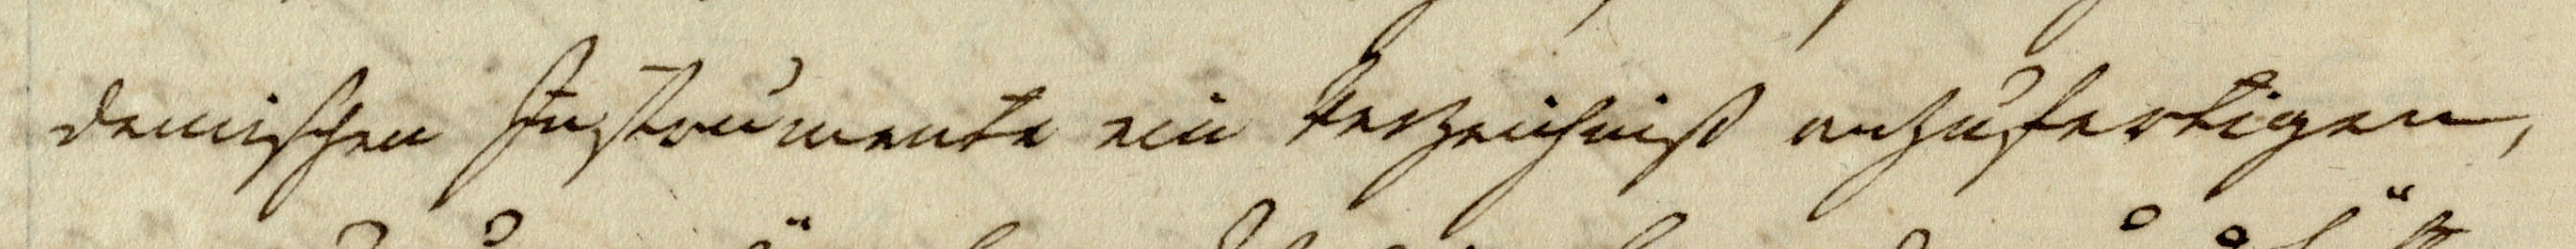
demischen Instrumente ein Verzeichniß anzufertigen,
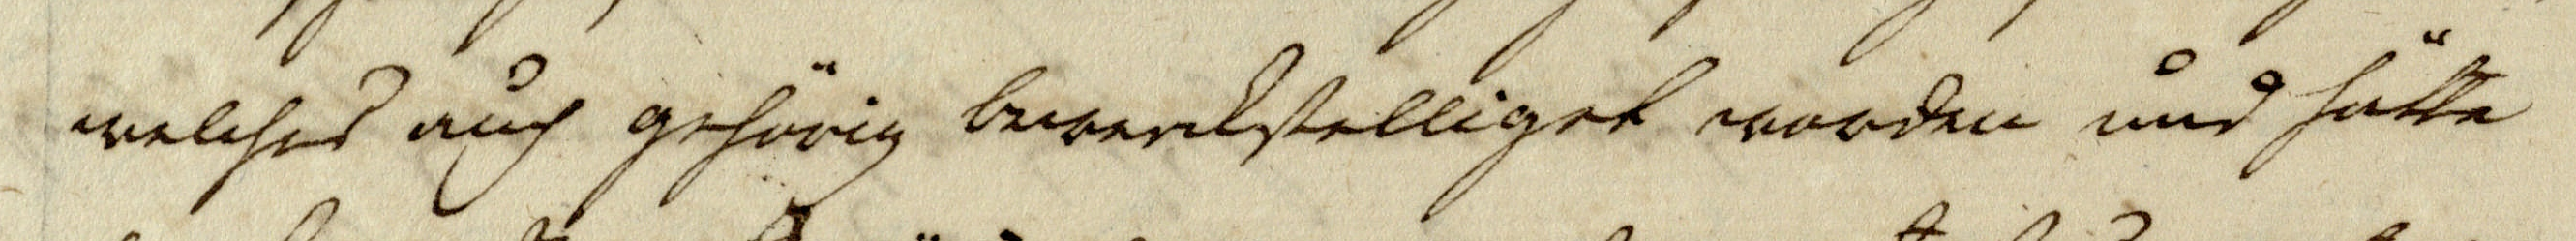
welches auch gehörig bewerckstelliget worden und hätte
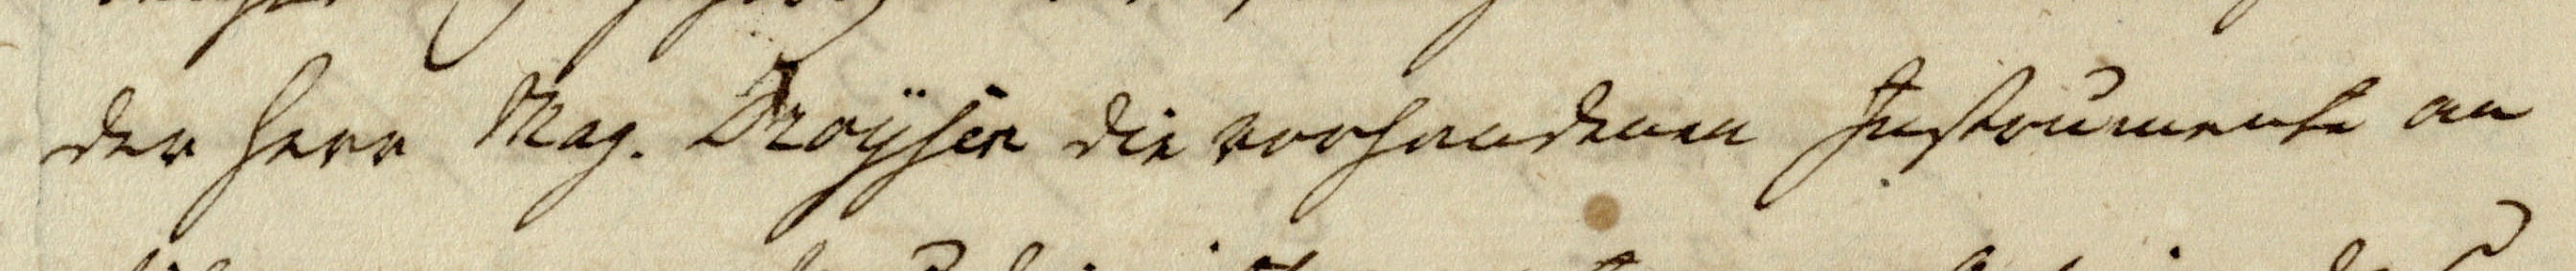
der Herr Mag. Droÿsen die vorhandenen Instrumente an
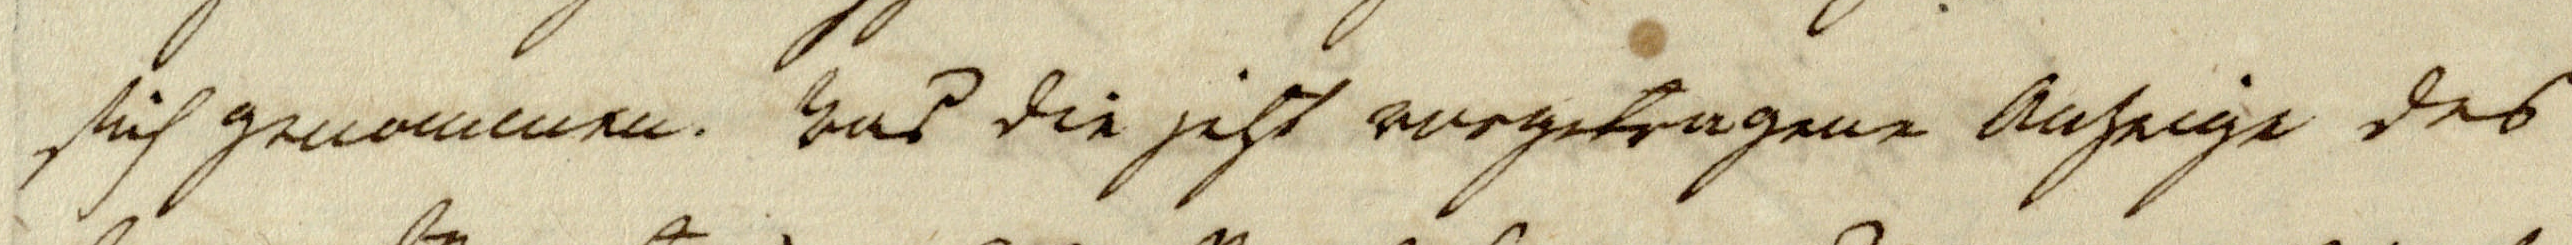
sich genommen. Was die jetzt vorgetragene Anzeige des
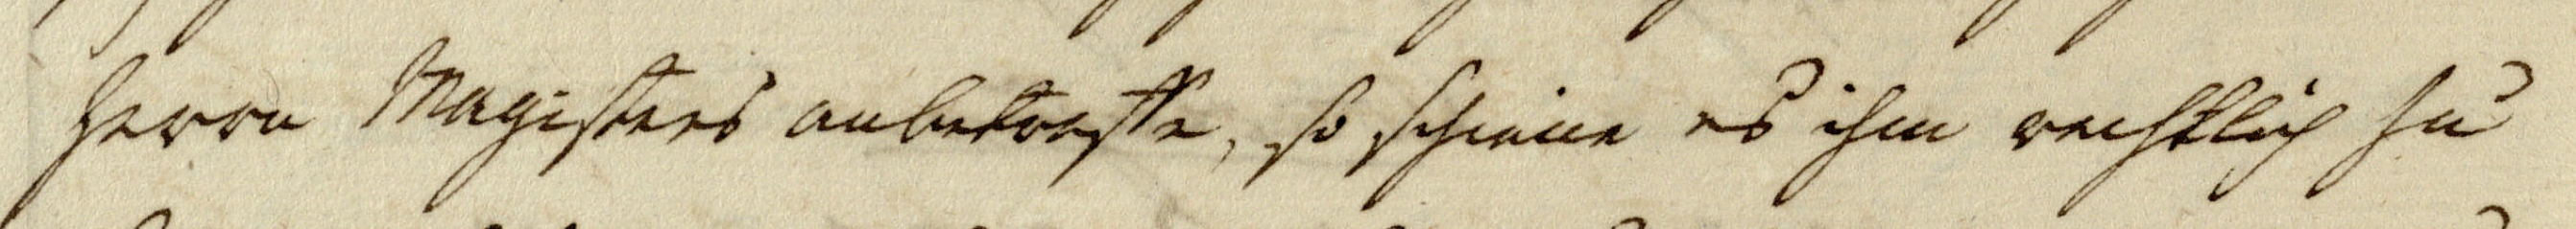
Herrn Magisters anbetreffe, so schiene es ihm rechtlich zu
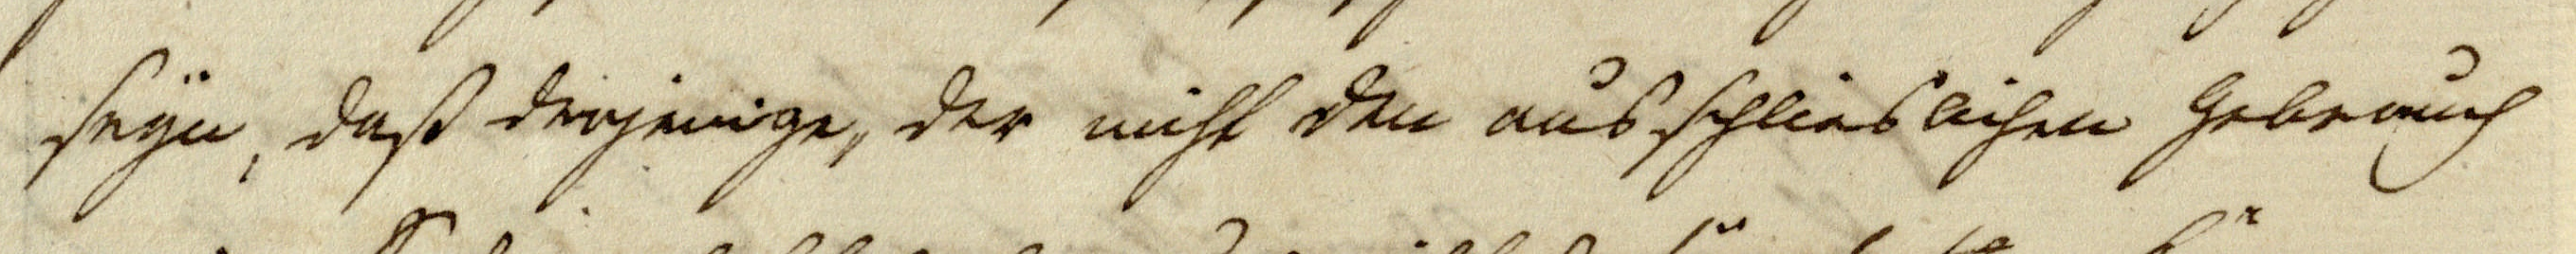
seÿn, daß derjenige, der nicht den ausschlieslichen Gebrauch
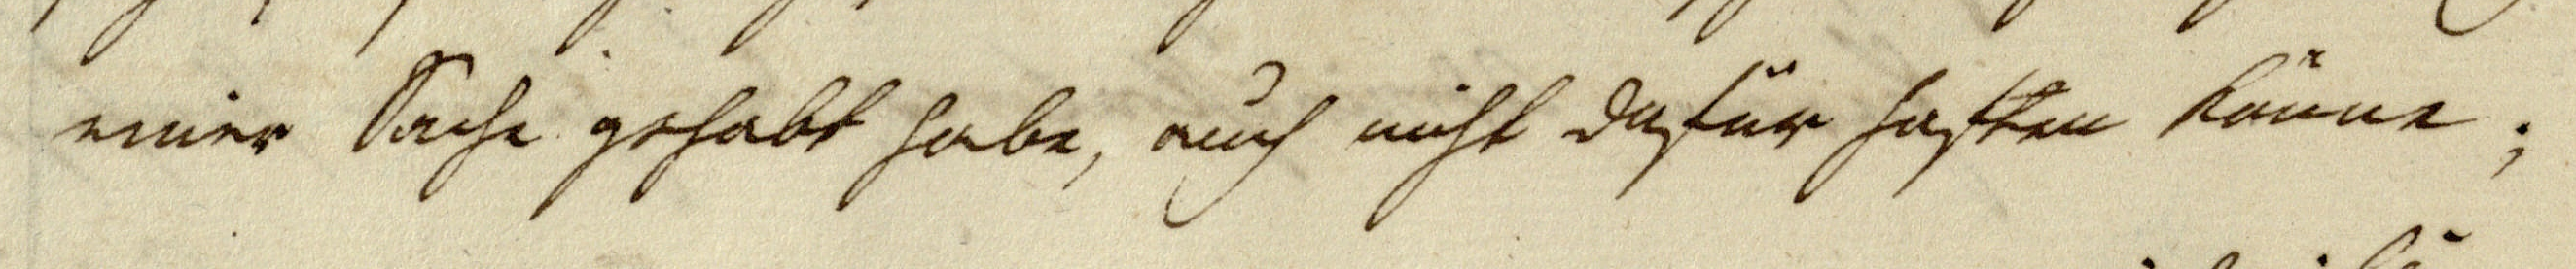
einer Sache gehabt habe, auch nicht dafür haften könne;
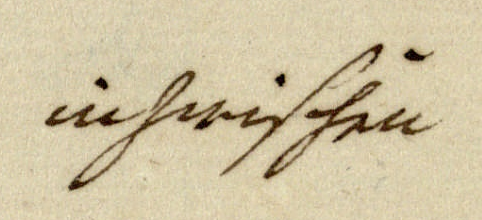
inzwischen
